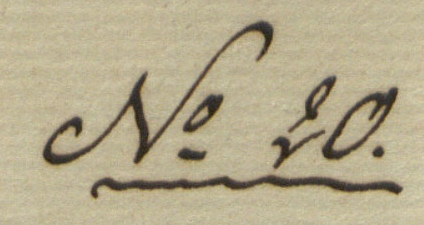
No 20.
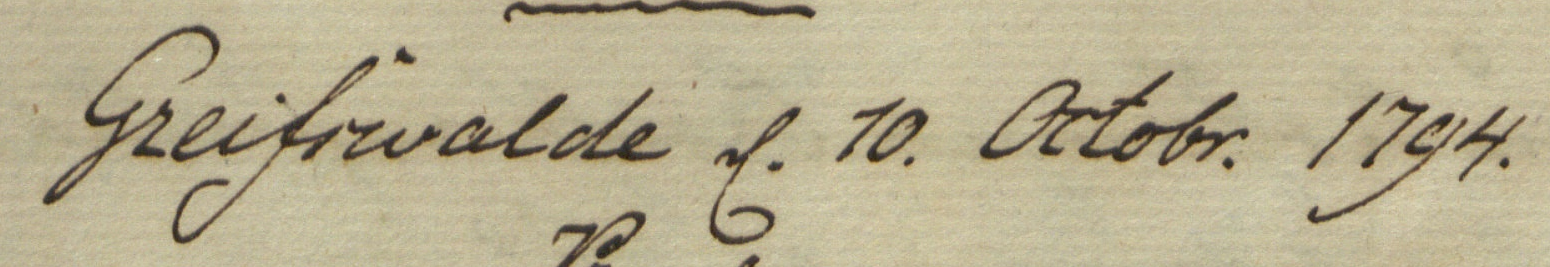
Greifswalde d. 10. Octobr. 1794.
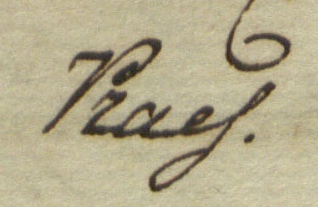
Praes.
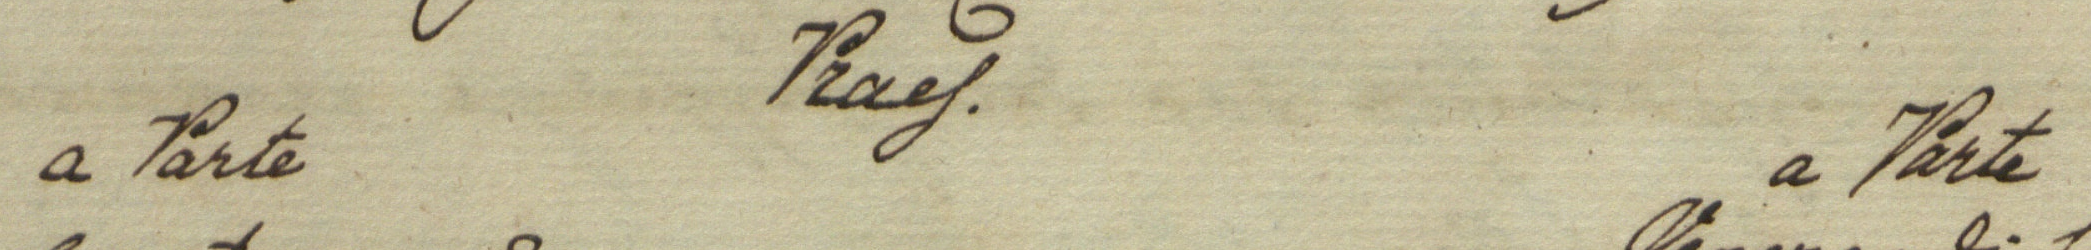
a Parte a Parte
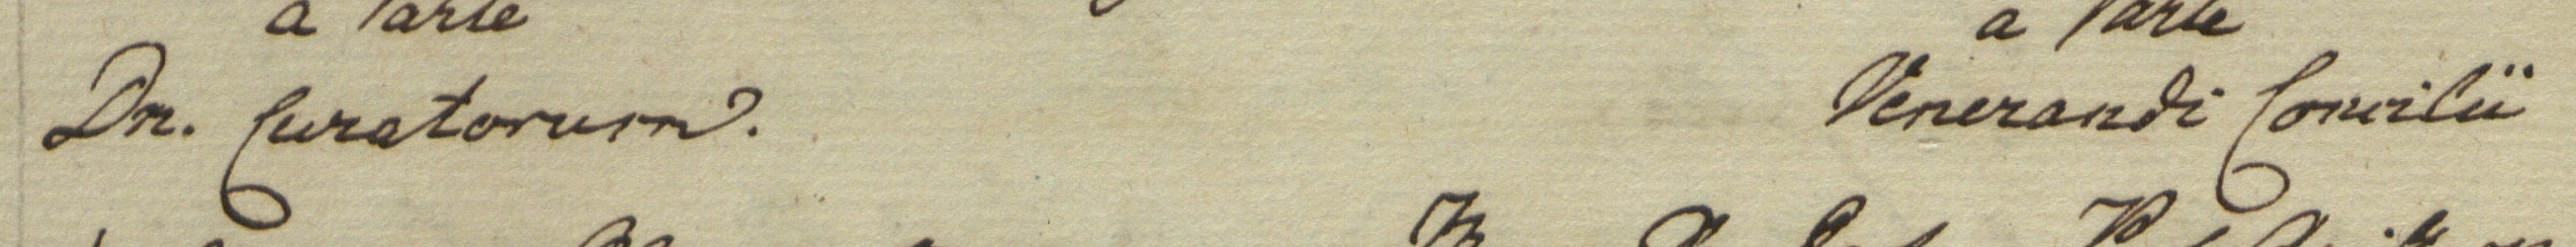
Dn. Curatorum. Venerandi Concilii
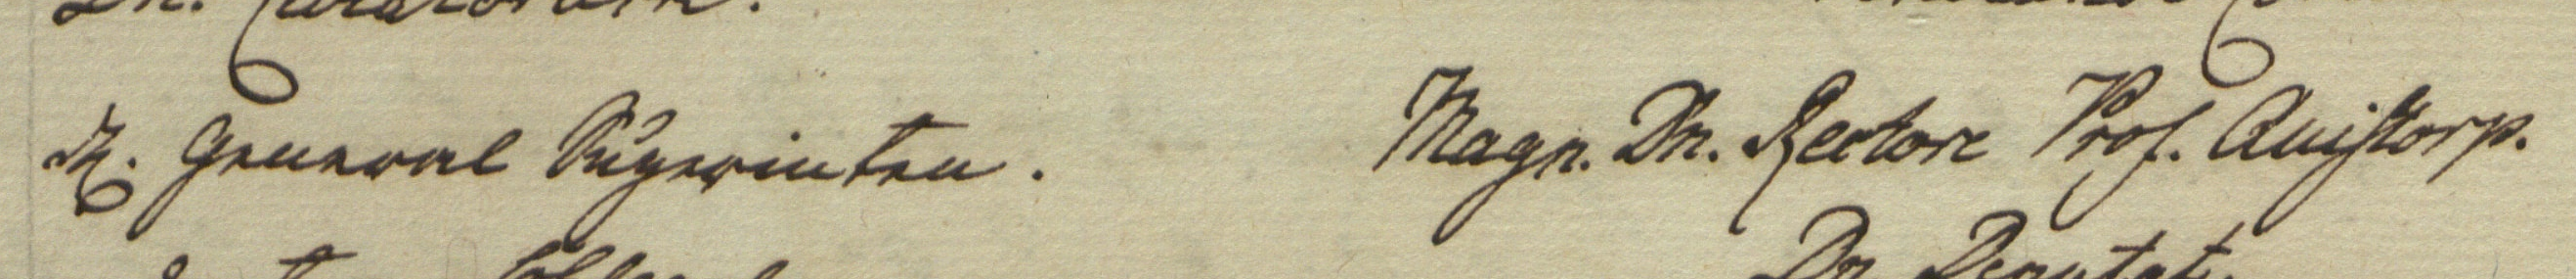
dh General Superinten¬ Magn. Dn. Rector Prof. Quistorp.
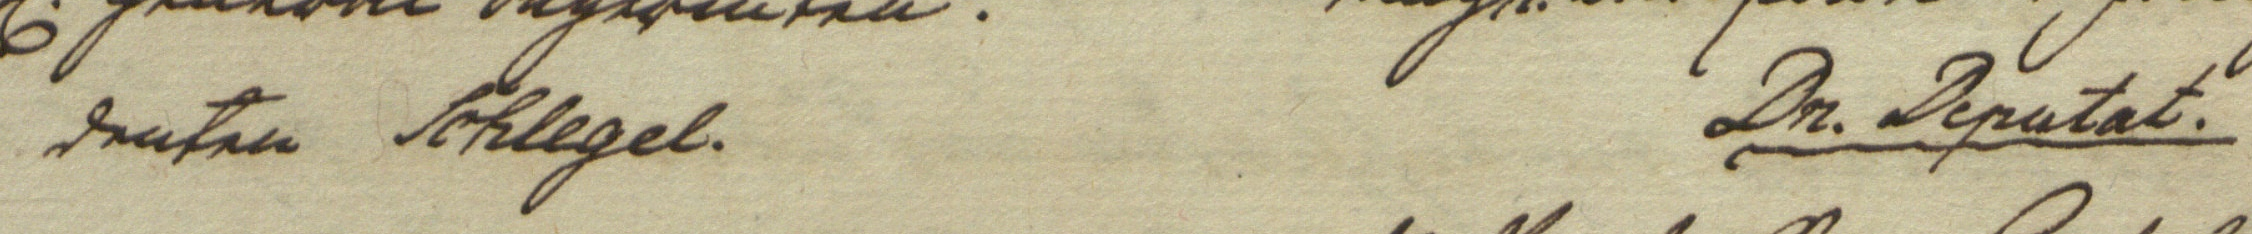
denten Schlegel. Dn. Deputat.
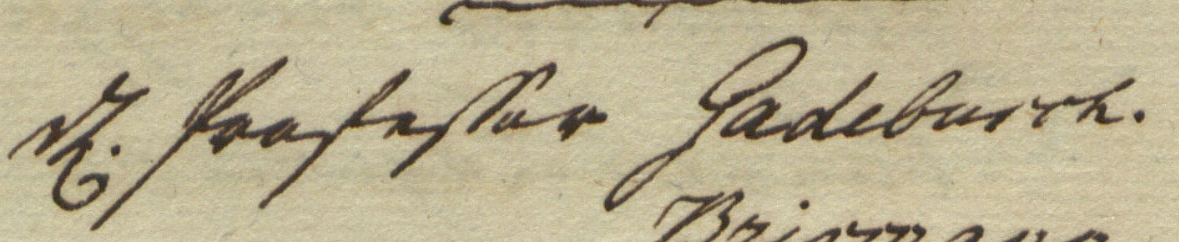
dh. Professor Gadebusch.
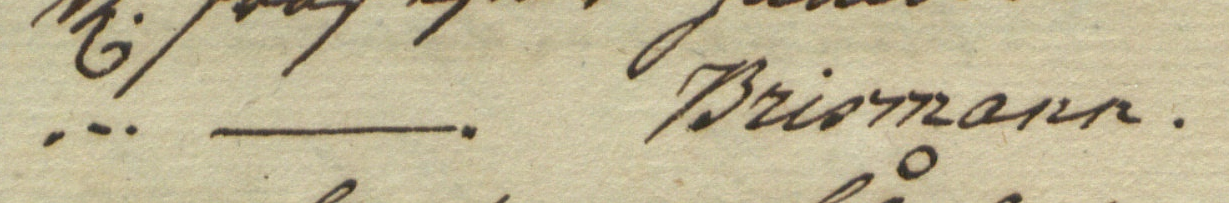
Brismann.
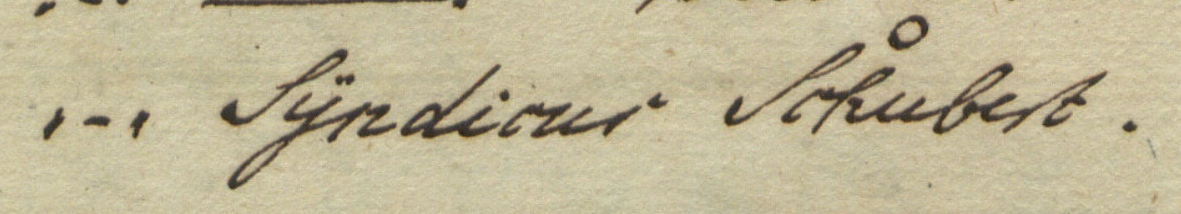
Sÿndicus Schubert.
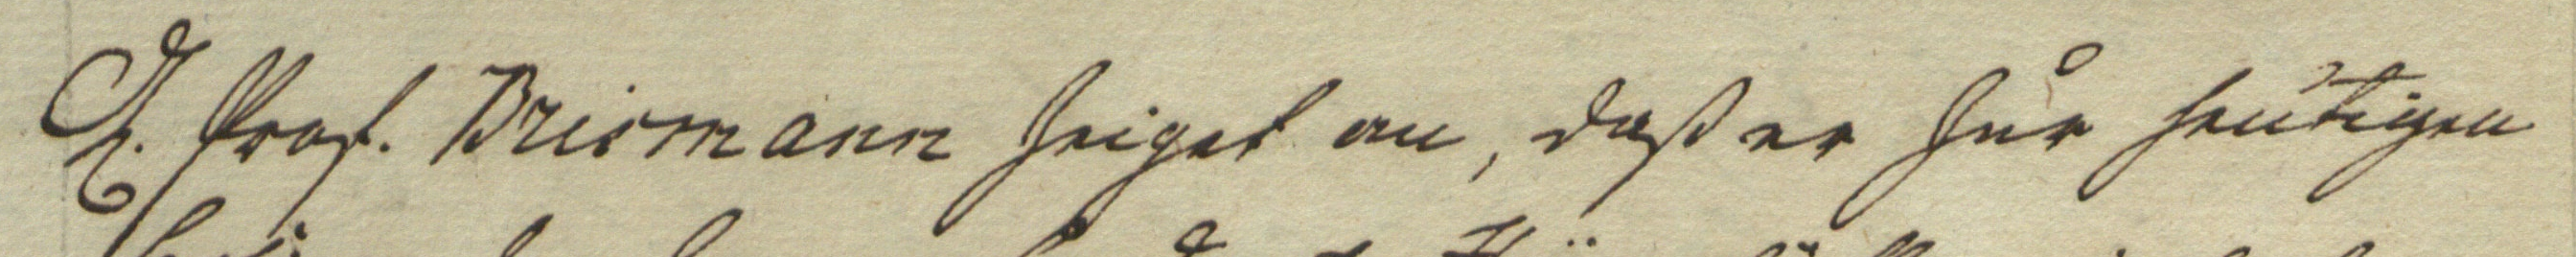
dh. Prof. Brismann zeiget an, daß er zur heutigen
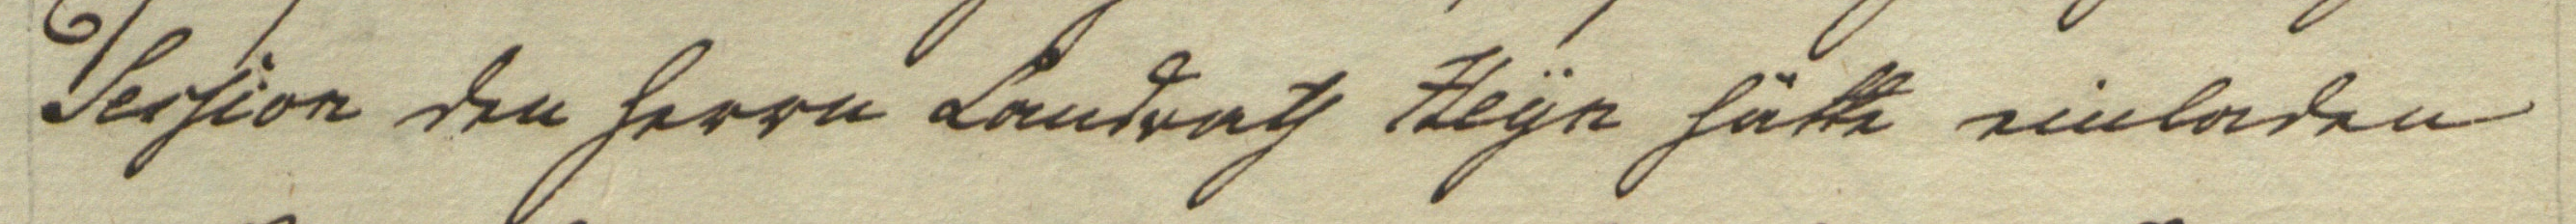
Session den Herrn Landrath Heÿn hätte einladen
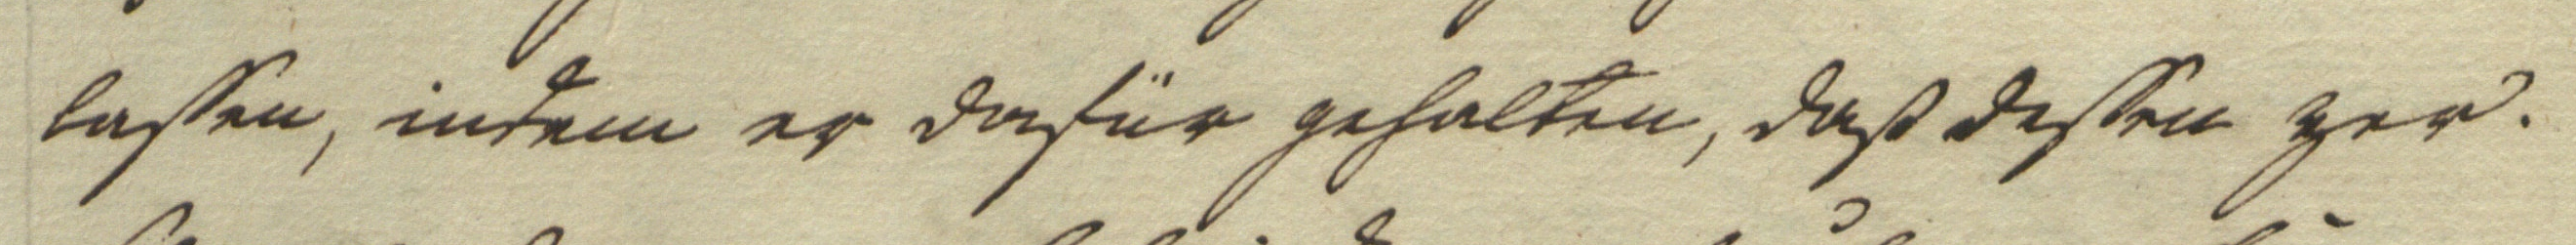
lassen, indem er dafür gehalten, daß dessen per¬
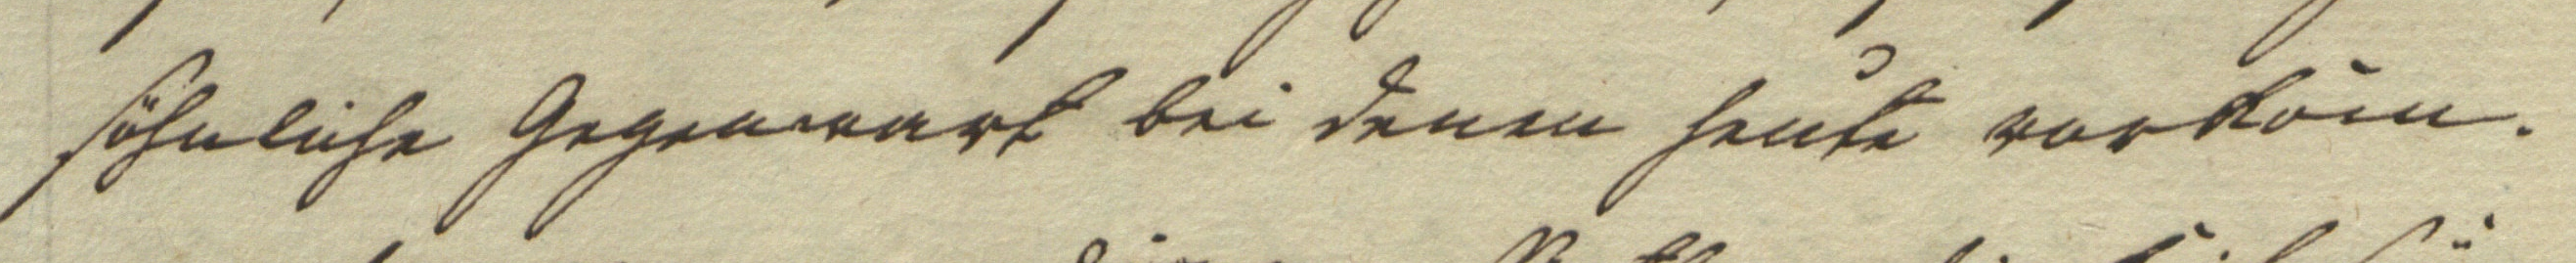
söhnliche Gegenwart bei denen heute vorkom¬
